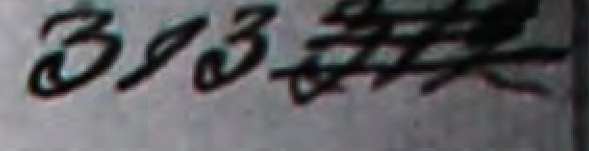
313 312
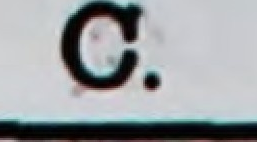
C.
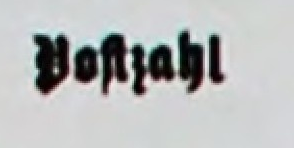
Postzahl
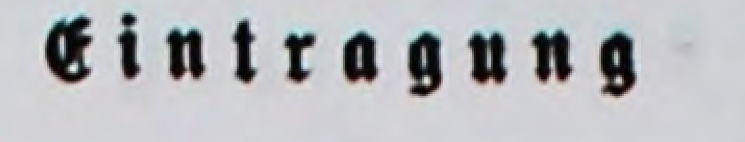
Eintragung
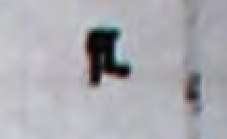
fl
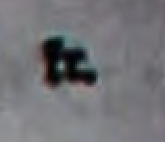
tr
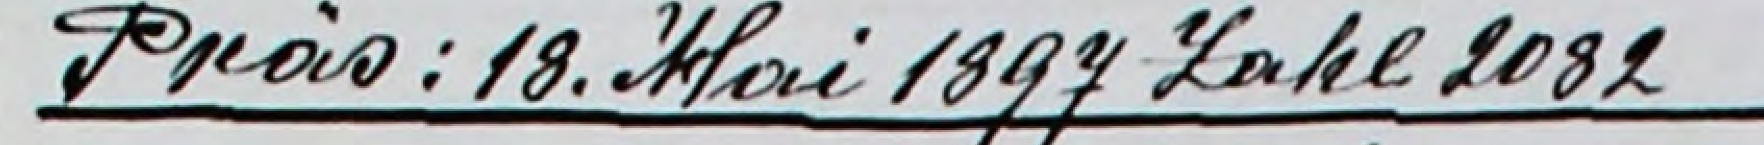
Präs: 18. Mai 1897 Zahl 2082
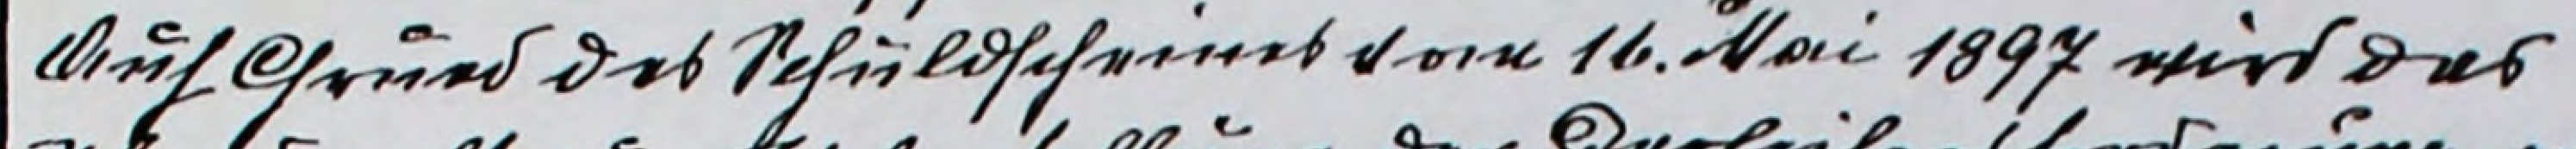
Auf Grund des Schuldscheines vom 16. Mai 1897 wird das
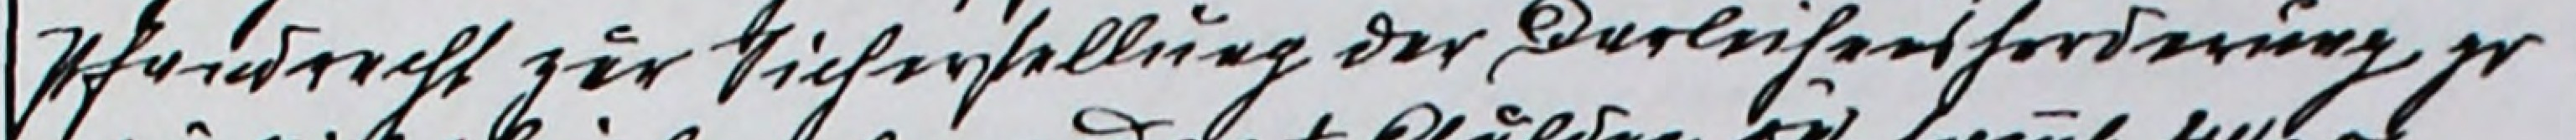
Pfandrecht zur Sicherstellung der Darleihensforderung pr
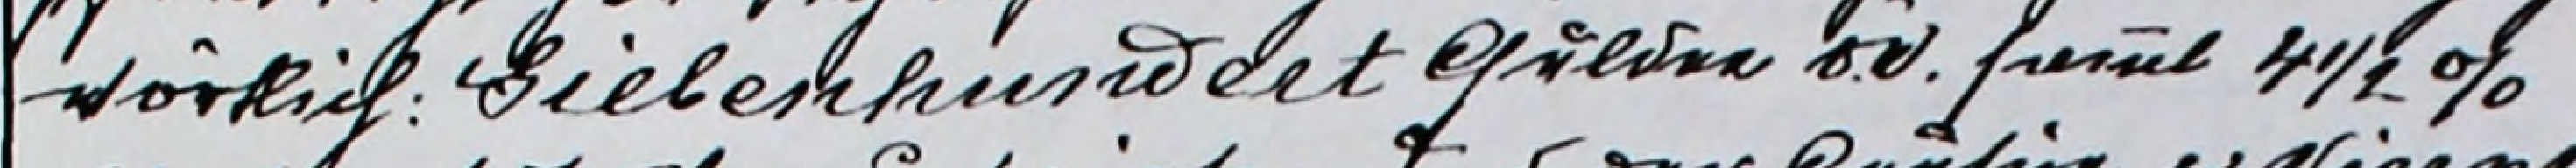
wörtlich: Siebenhundert Gulden ö.k. sammt 4 1/2%
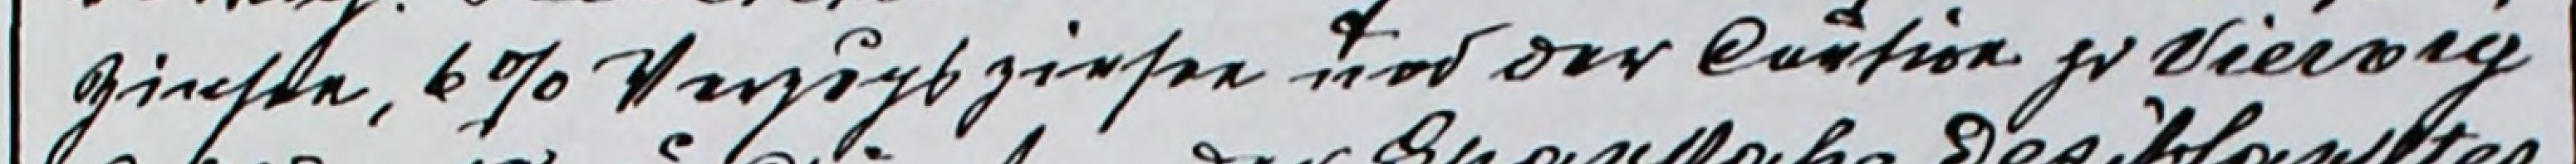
Zinsen, 6% Verzugszinsen und der Caution pr Vierzig
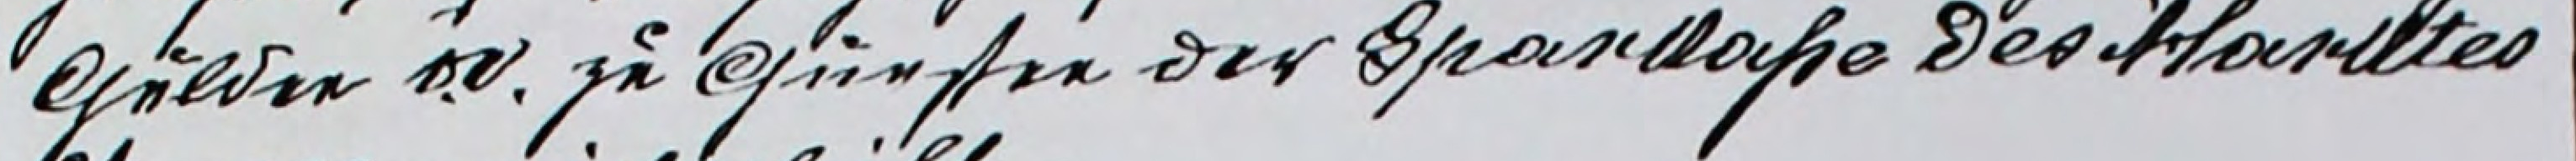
Gulden ö.k. zu Gunsten der Sparkasse des Marktes
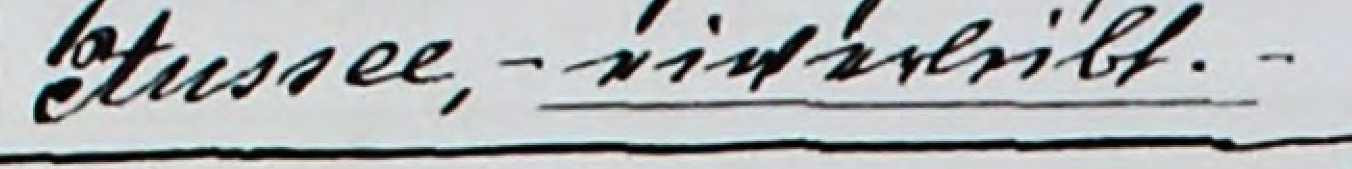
Aussee, - einverleibt. -
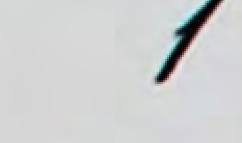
1
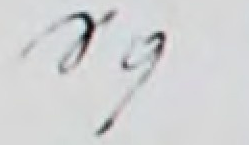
s 9
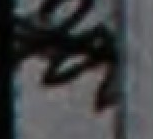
???
